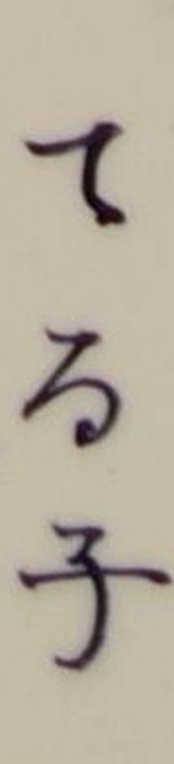てる子
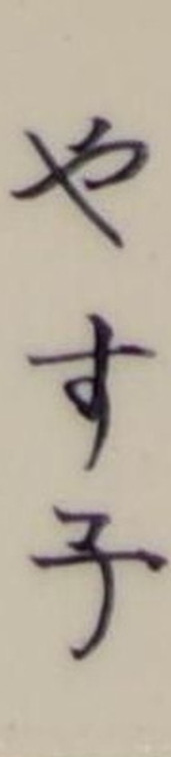やす子
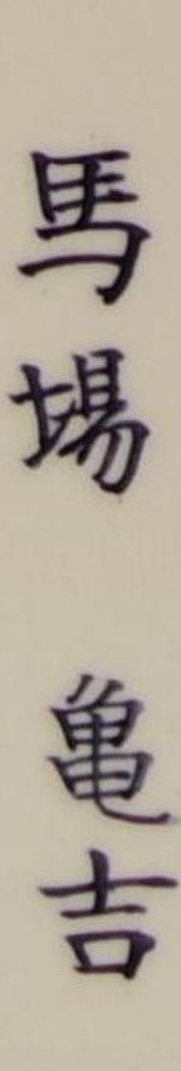馬場亀吉

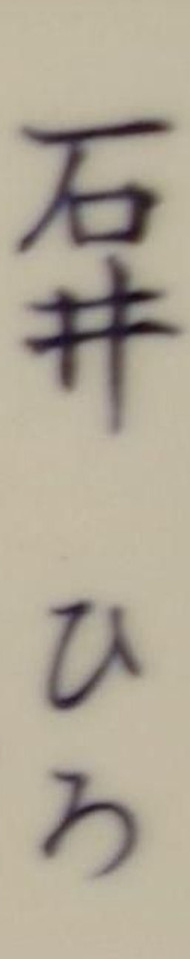石井ひろ
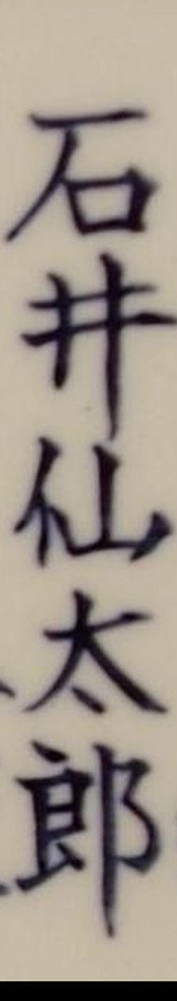石井仙太郎
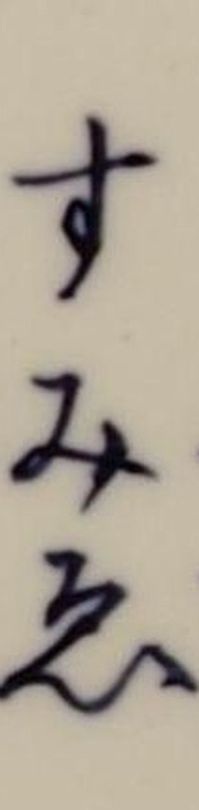すみえ
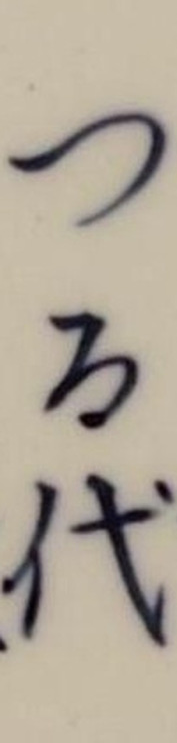つる代
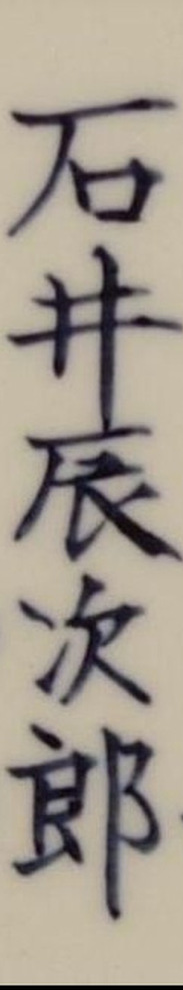石井辰次郎

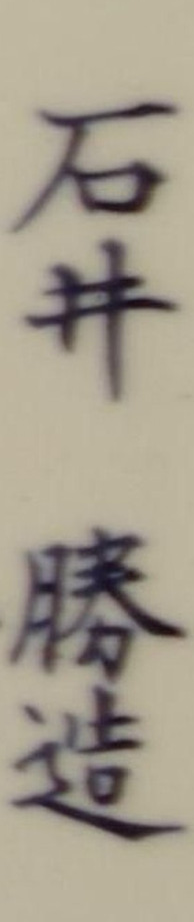石井勝造
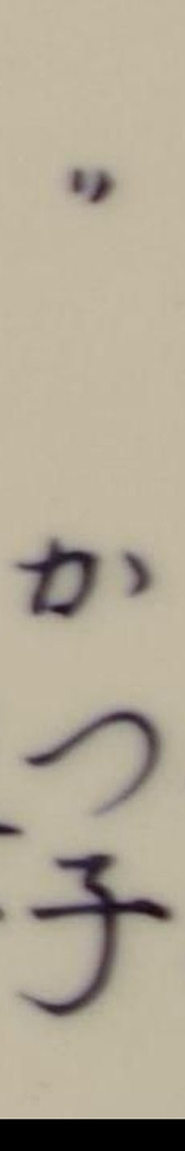かつ子
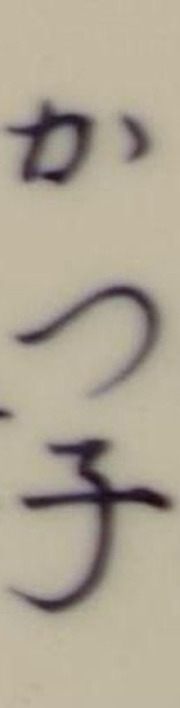かつ子
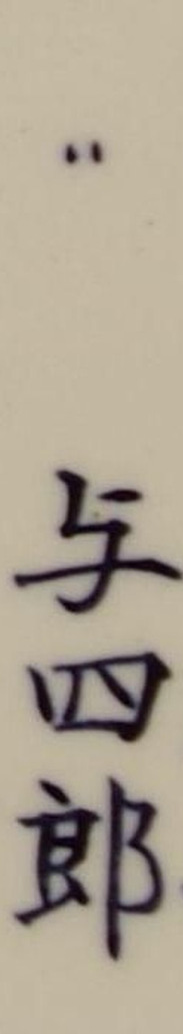与四郎
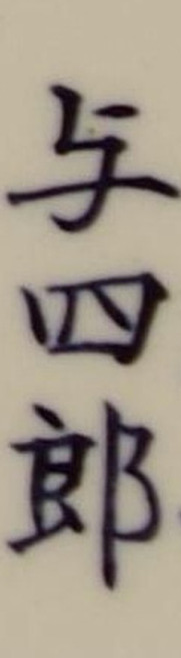与四郎
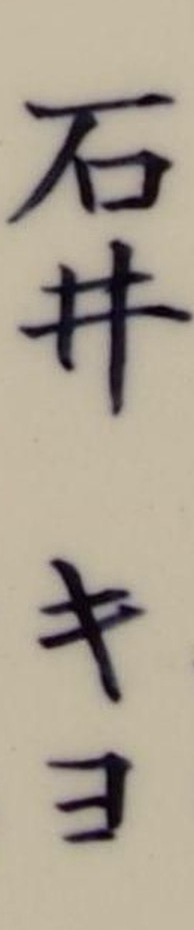石井キヨ
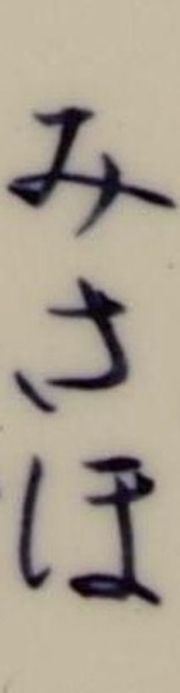みさほ
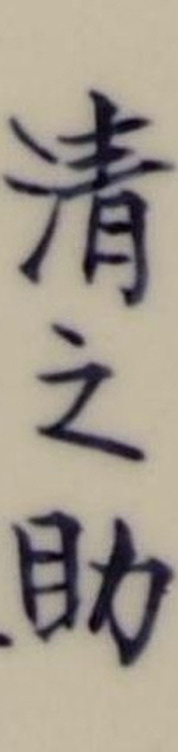清之助
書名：M~S
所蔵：高野山金剛峯寺
